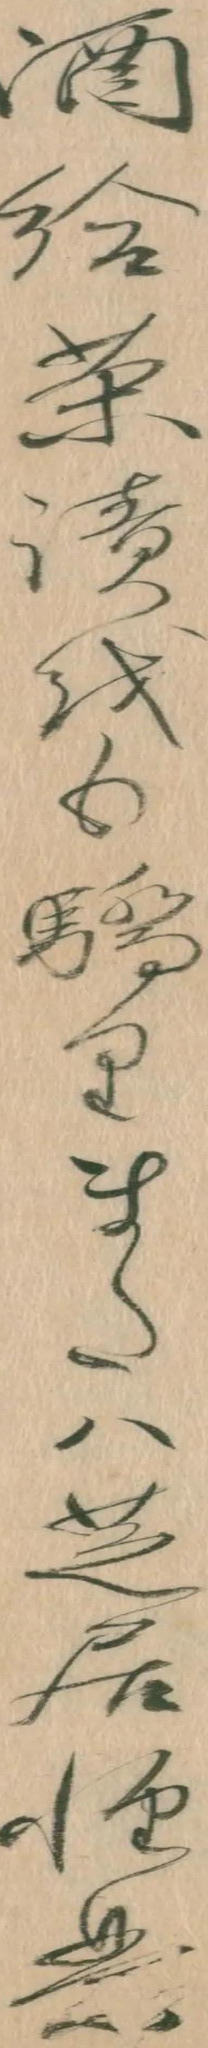酒給茶漬をも驕りまたは芝居軽業
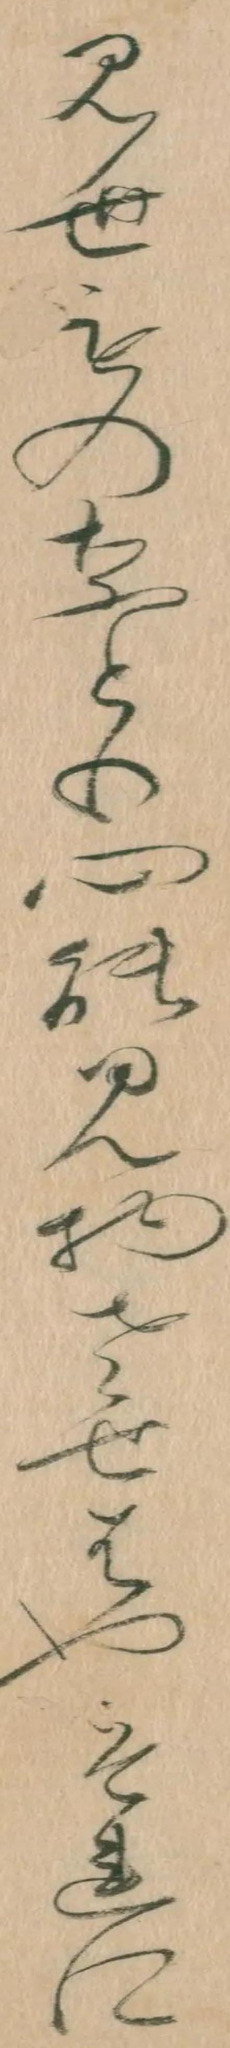見世ものなとの心の見物させはやそれに
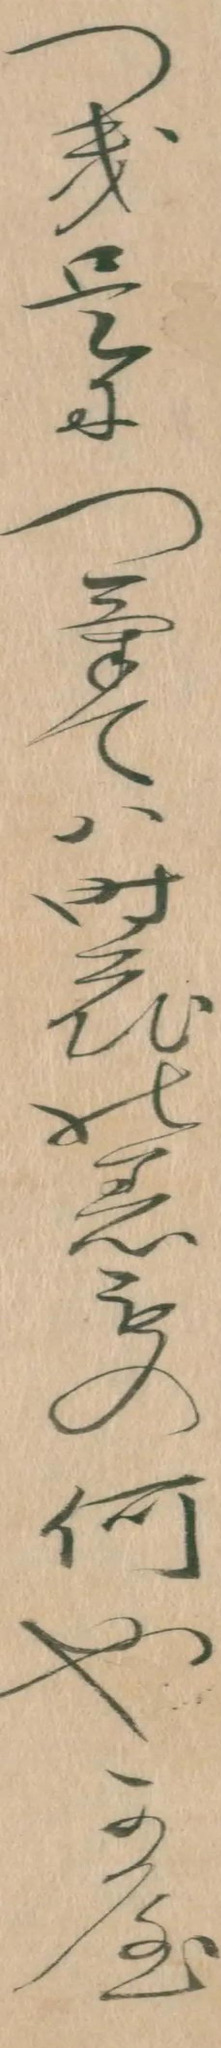つき是につけては時花の着もの何やかや
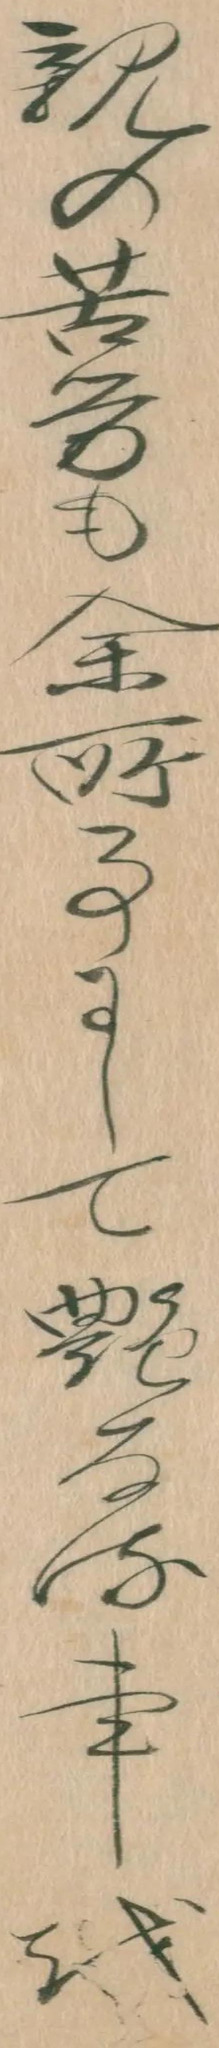親の苦労も余所事にして艶なる事を
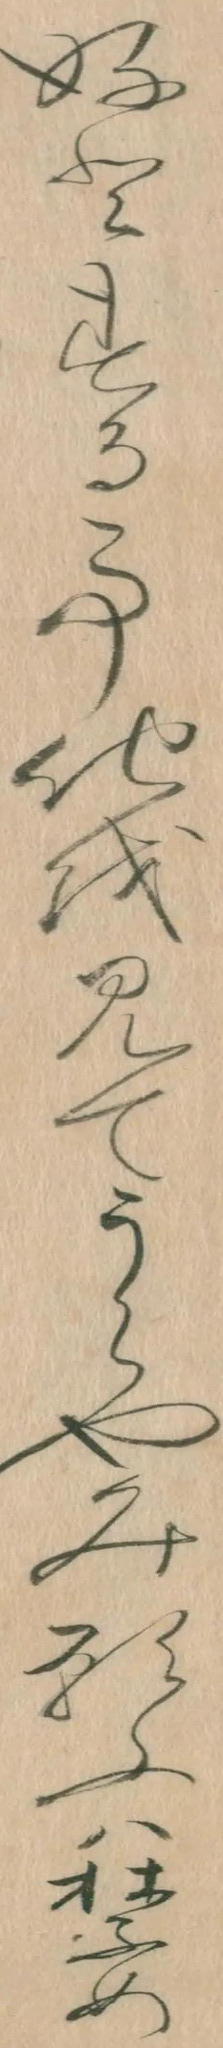好とする事他を見てうらやみ願ふは禁め
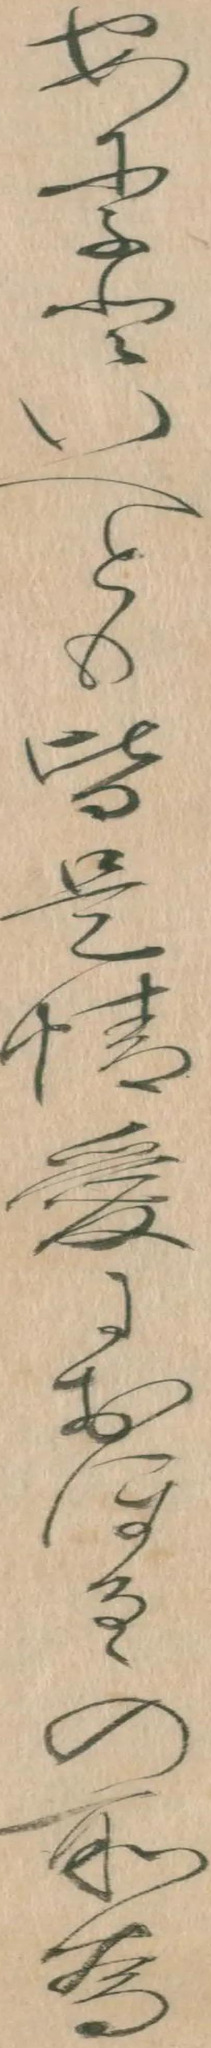あきといへとも皆是情愛におほるゝの所爲
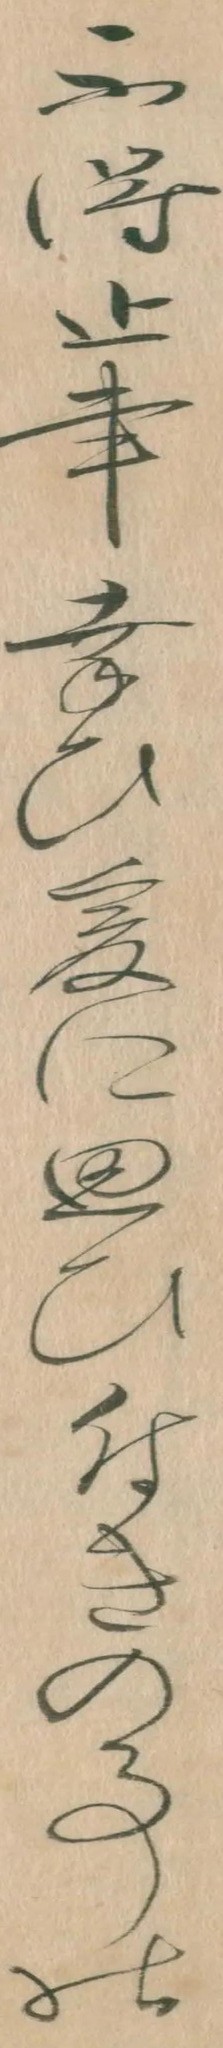不得止事幸ひ爰に思ひ付きの事の
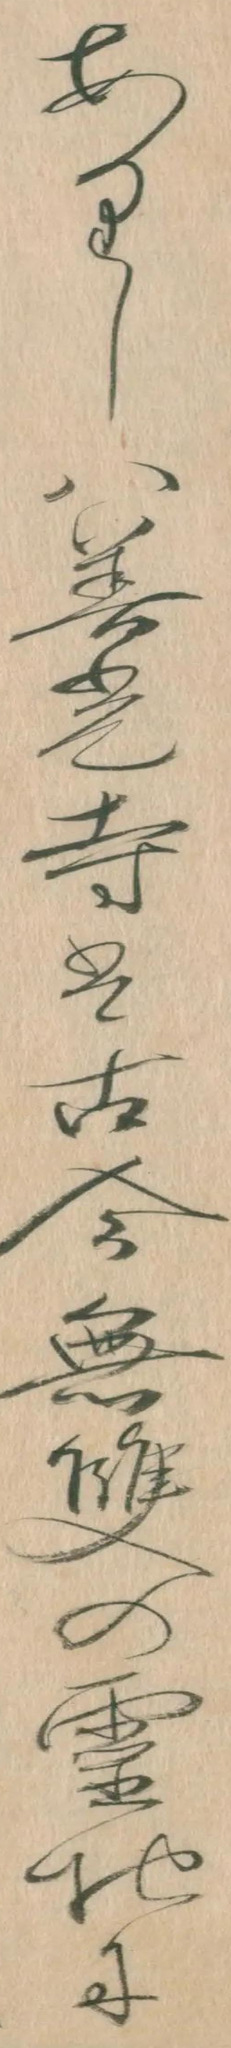ありしは善光寺は古今無雙の霊地に
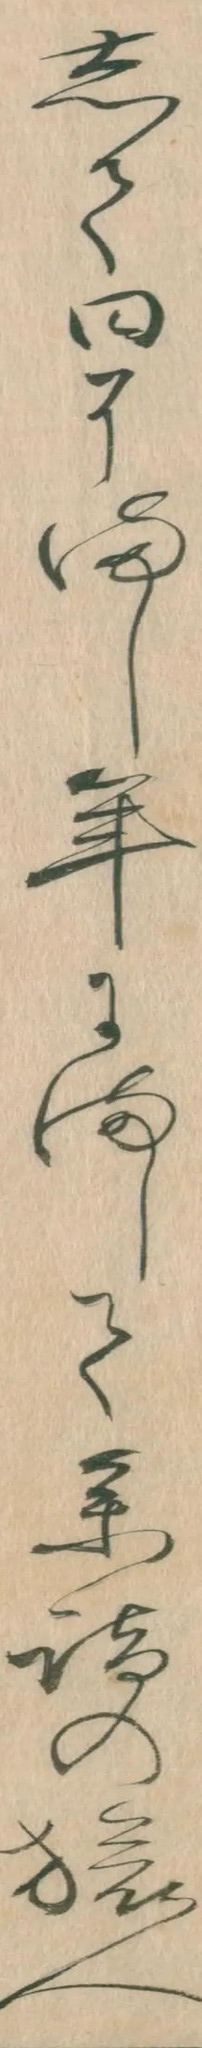して日にまし年にまして参詣の旅人
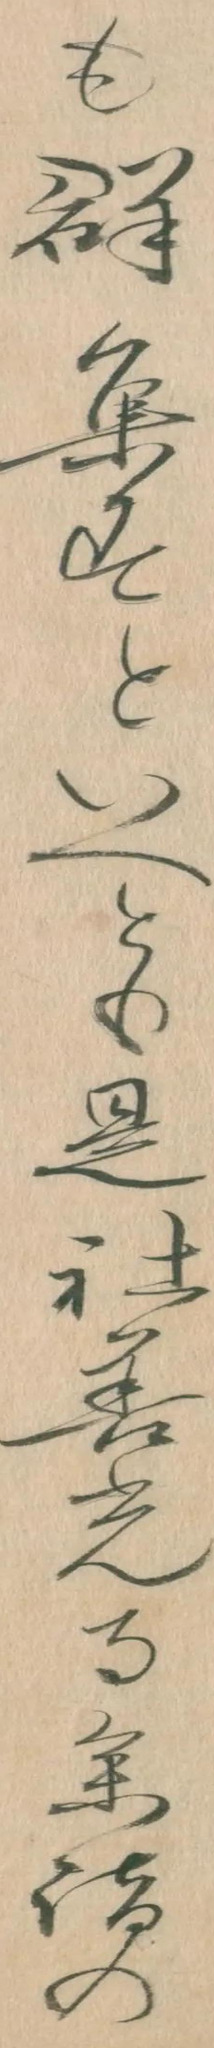も群集すといへとも是社善光寺参詣の
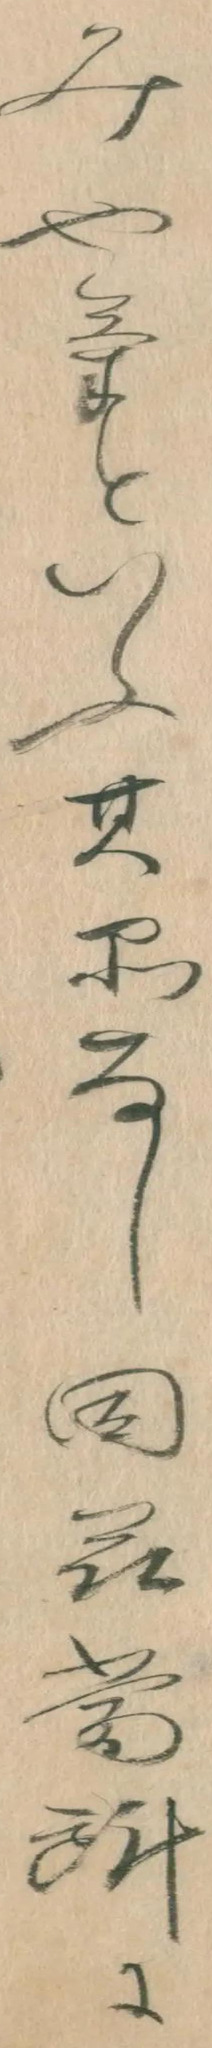みやけといふ其品なし同花當餅に
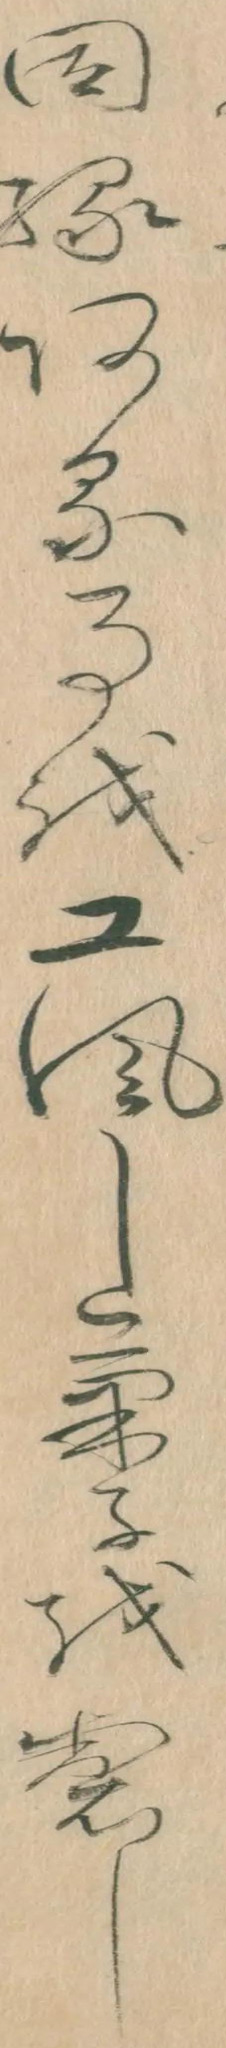同縁ある事を工風し菓子を製し

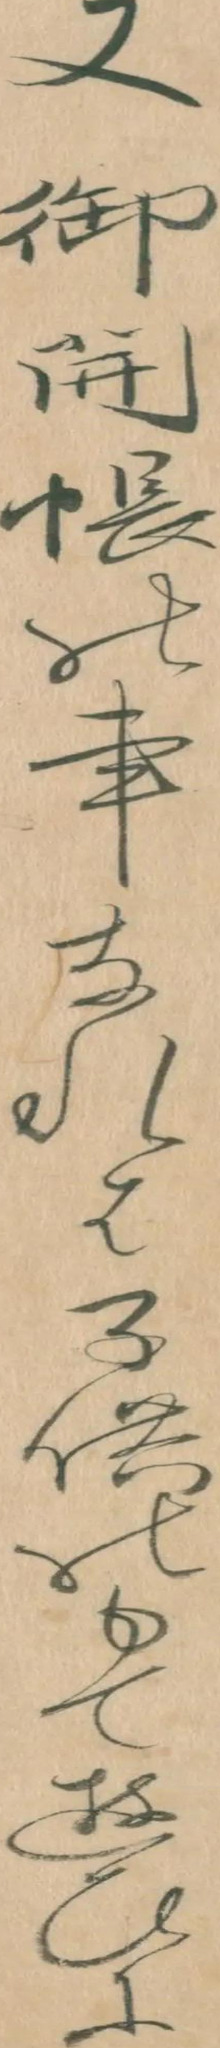又御開帳の事なれは子供のもて遊ひに
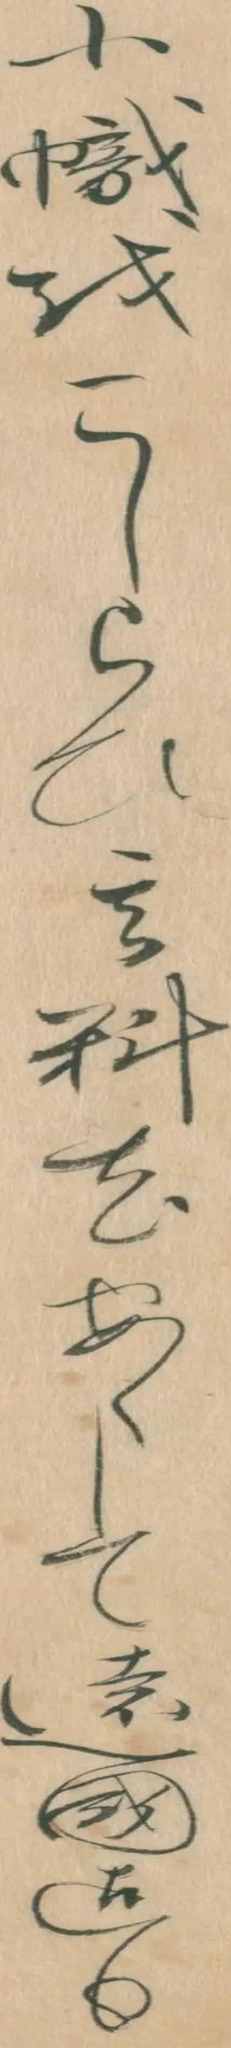小幟をこしらひ其料尤安くして遠国迄も
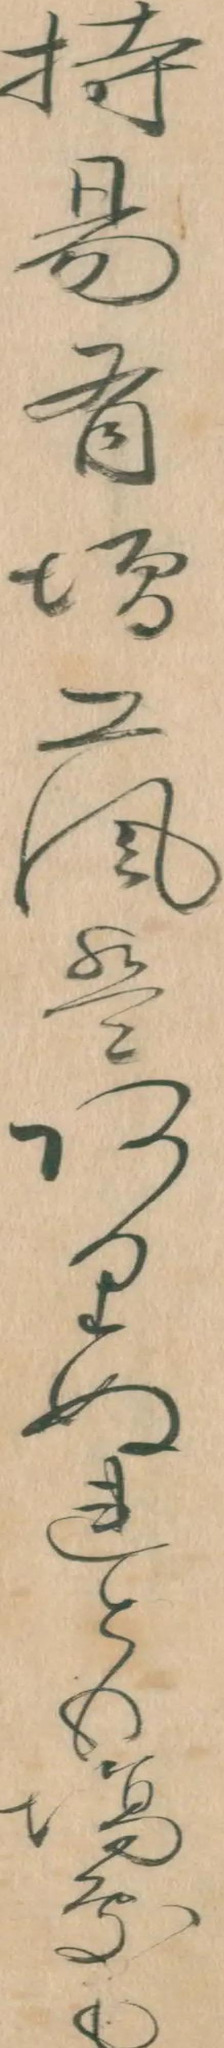持易有増工風はありぬれとも場處も
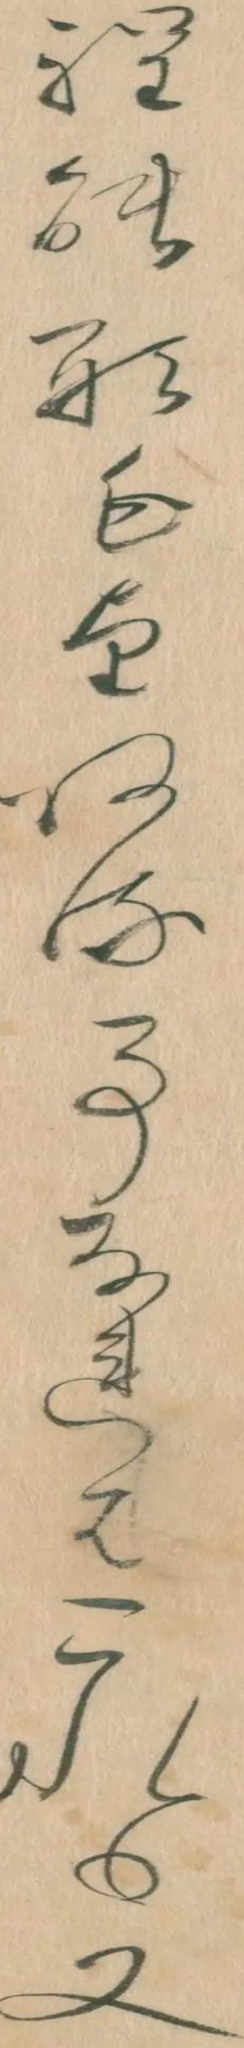程能形も望ある事なれはこれも又
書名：俗語之種. [2]
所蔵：国立国会図書館 National Diet Library, JAPAN
